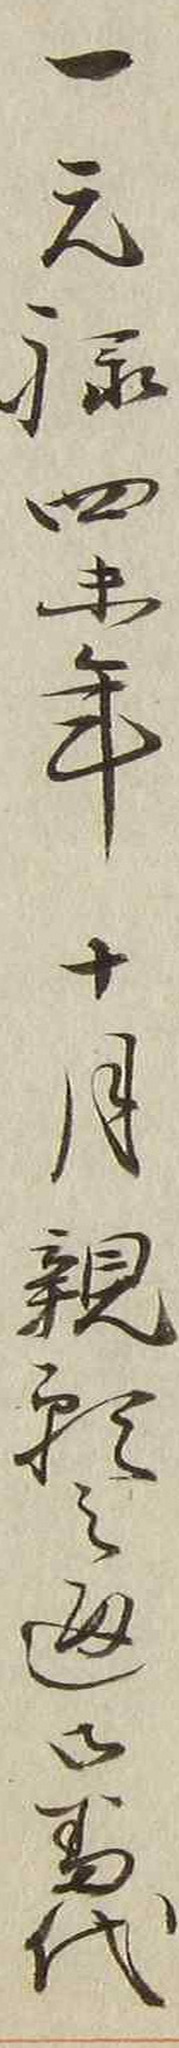一元禄四未年十月親願之通御番代
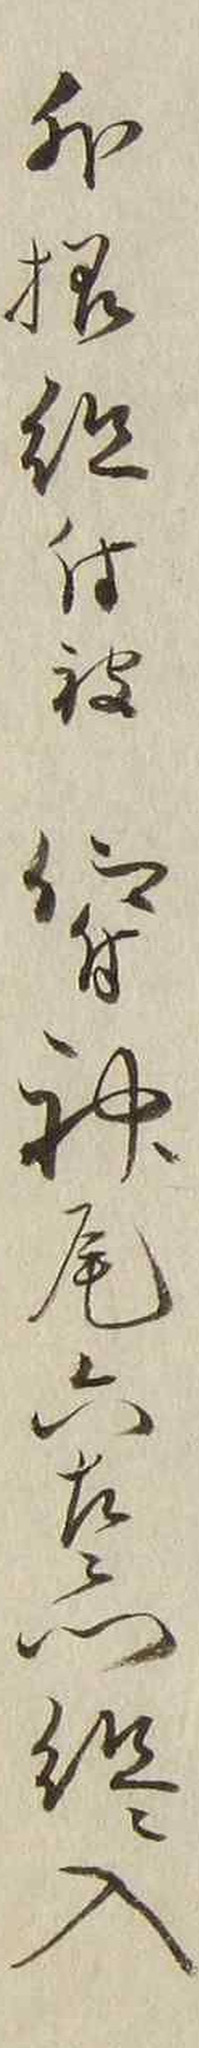外様組付被仰付神尾六左衛門組に入

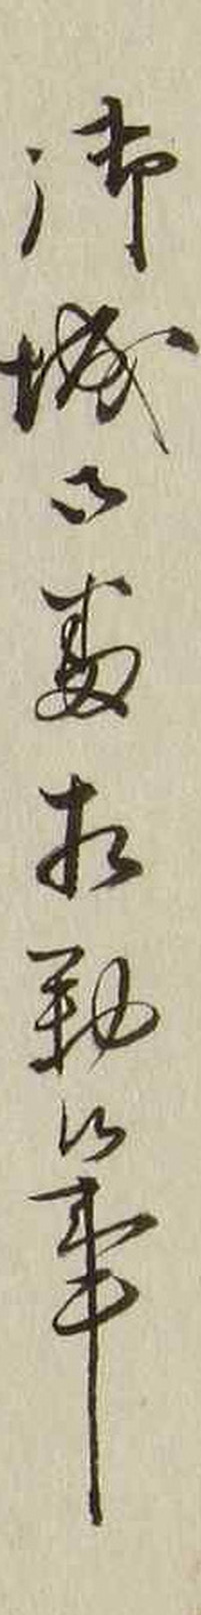御城御番相勤候事
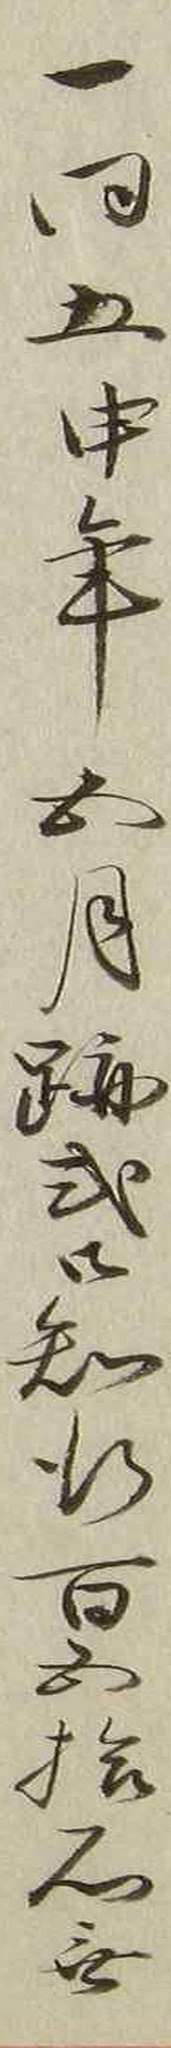一同五申年五月跡式御知行百五拾石無
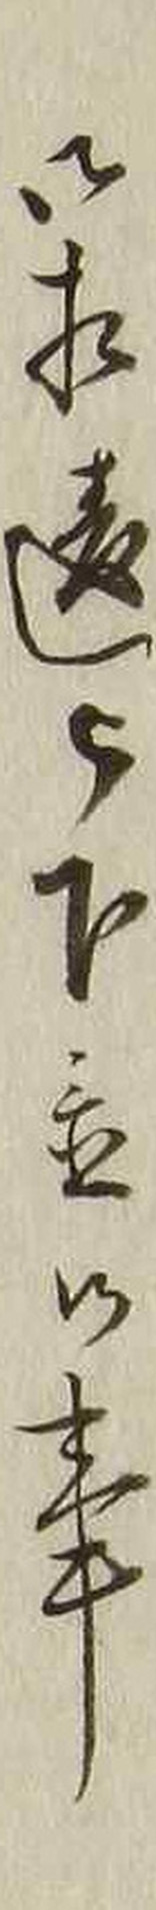御相違被下置候事
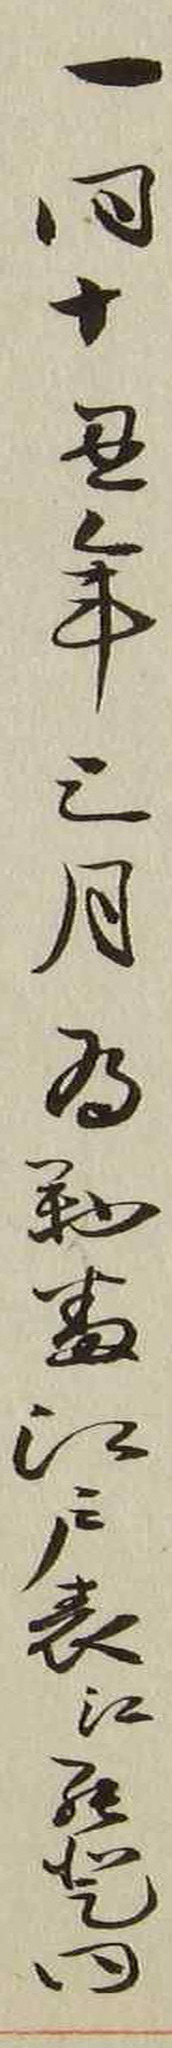一同十丑年三月為勤番江戸表え罷登同
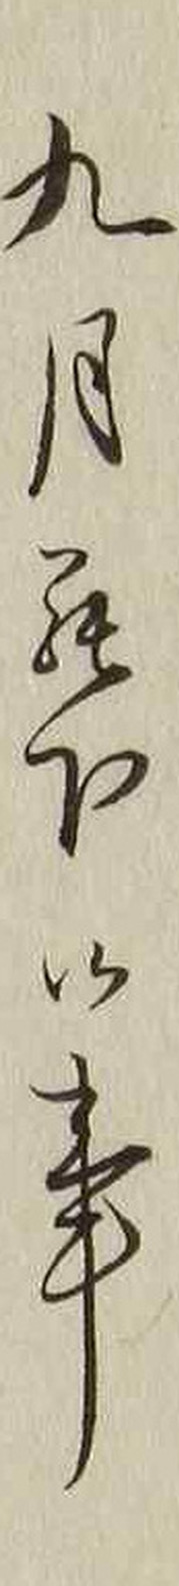九月罷下候事
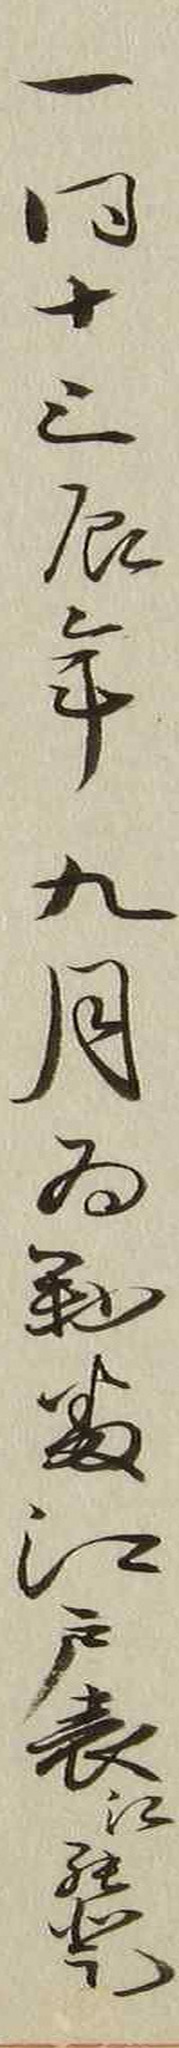一同十三辰年九月為勤番江戸表え罷登
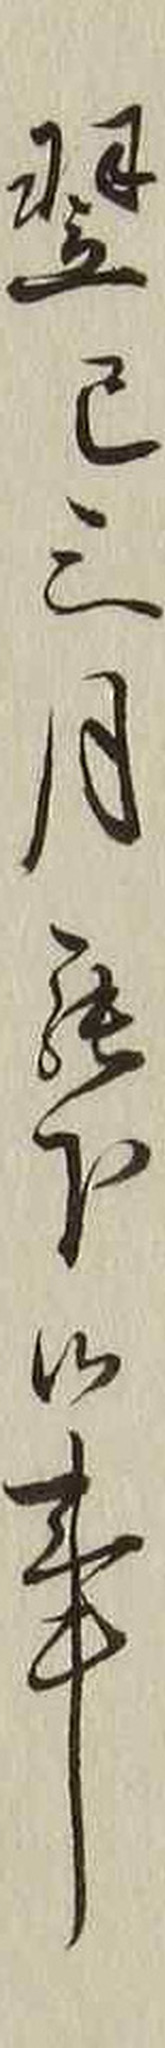翌巳三月罷下候事
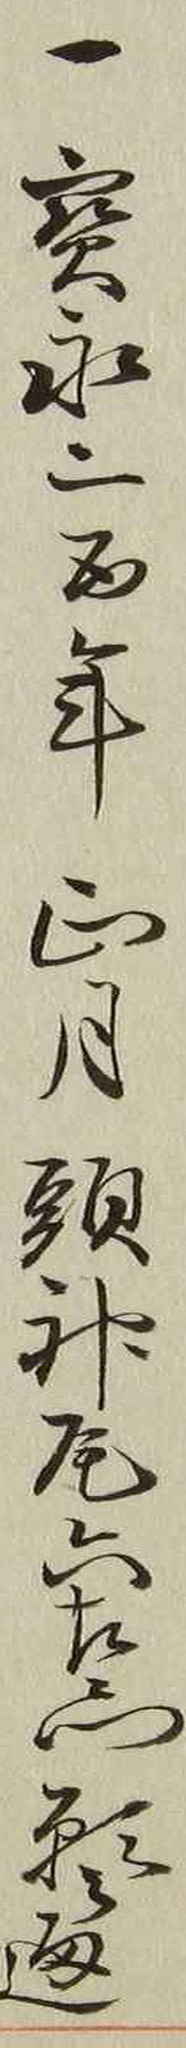一宝永二酉年正月頭神尾六左衛門願之通
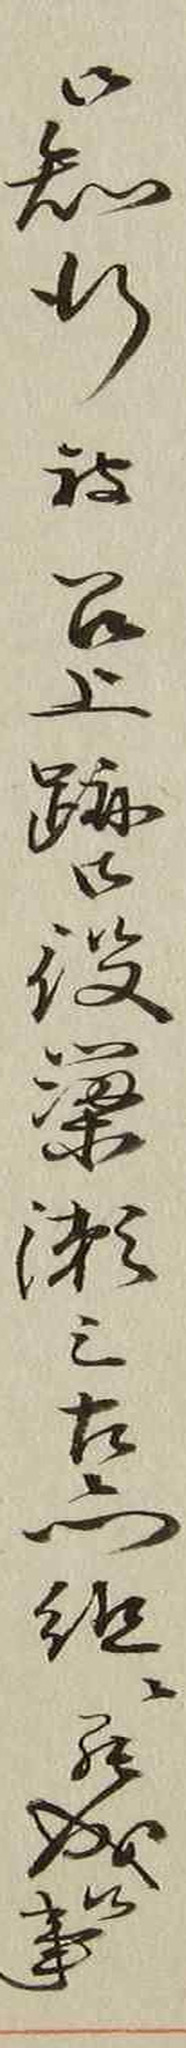御知行被召上跡御役簗瀬三左衛門組に罷成候事
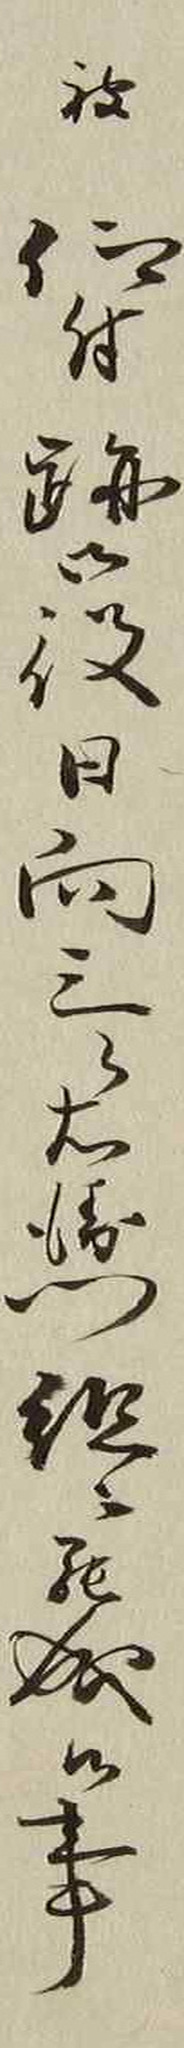被仰付跡御役日向三郎右衛門組に罷成候事
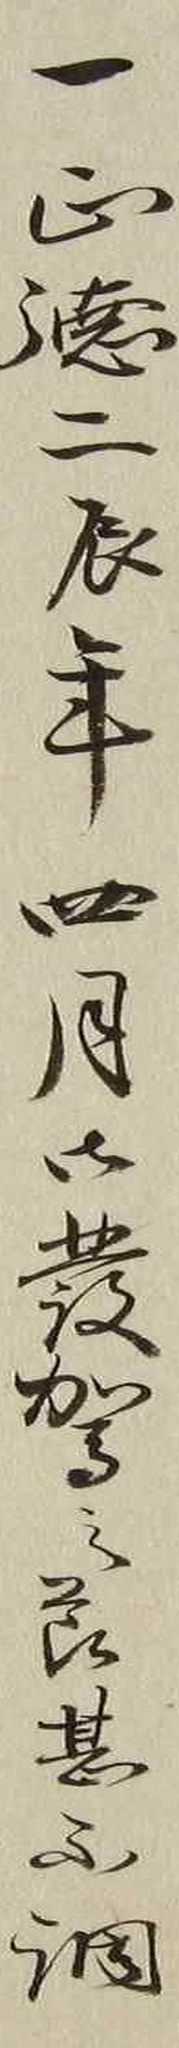一正徳二辰年四月御発駕之節甚不調
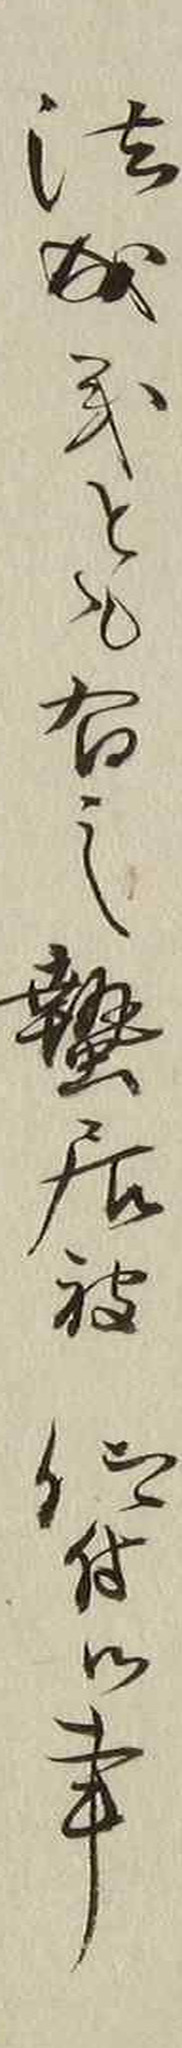法成義とも有之蟄居被仰付候事
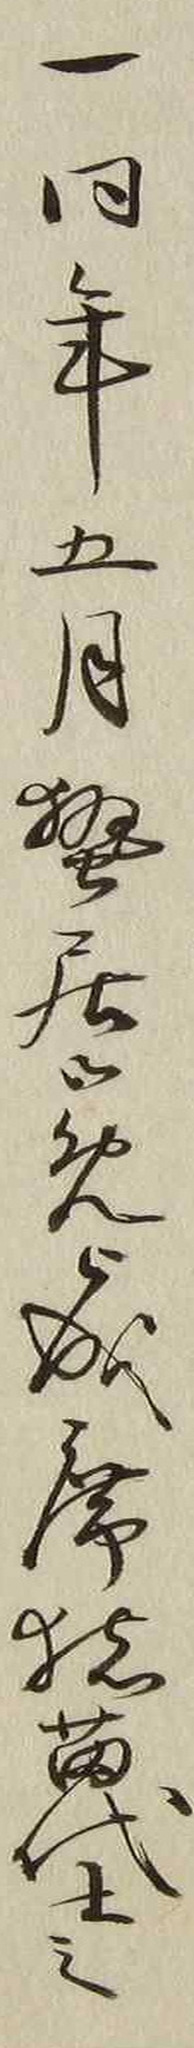一同年五月蟄居御免被成席猪苗代士之
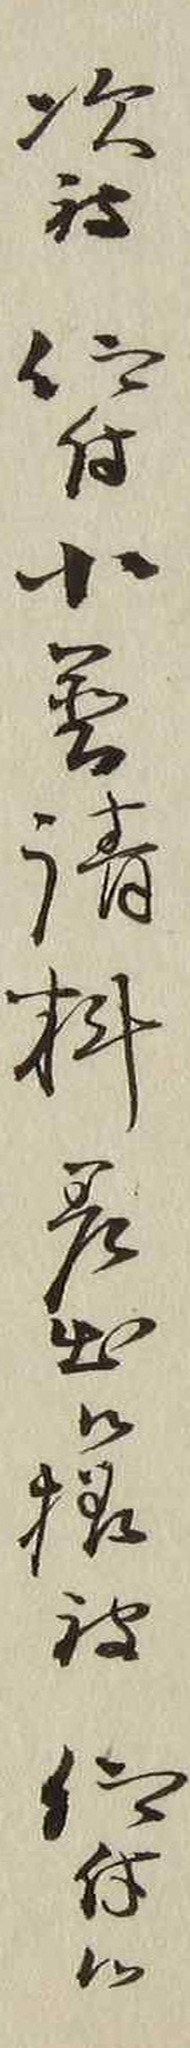次被仰付小普請料差出候様被仰付候
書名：諸士系譜　巻之157　ね之部1
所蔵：会津若松市立会津図書館
